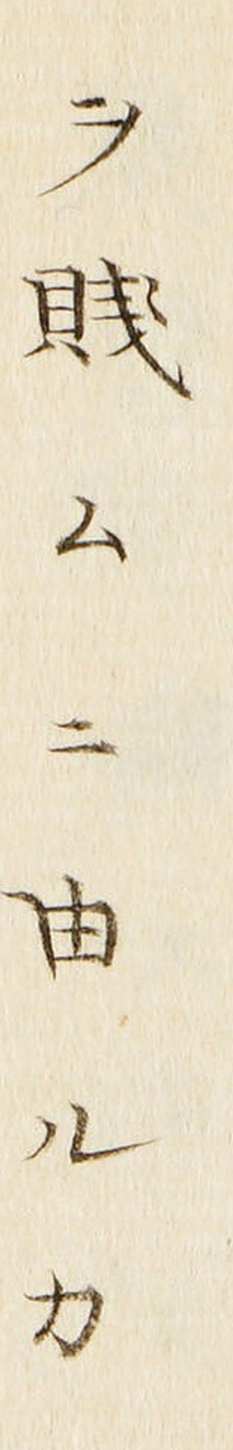ヲ賤ムニ由ルカ
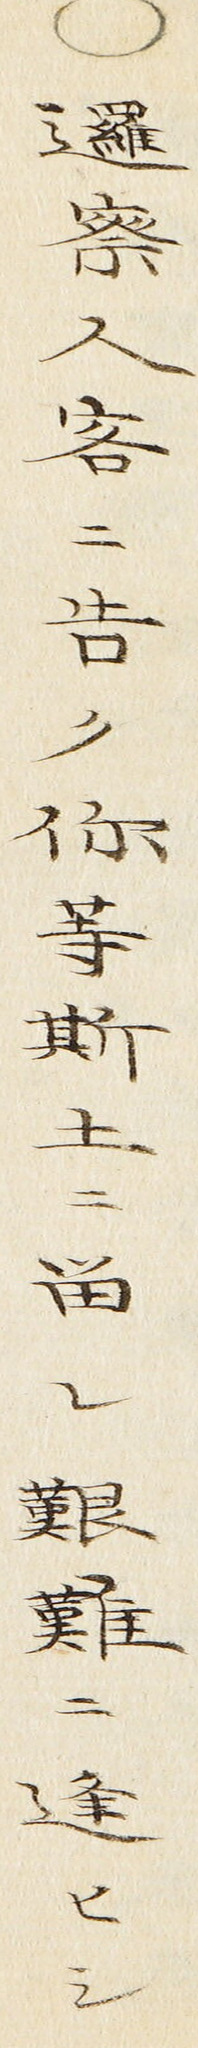〇邏察人客ニ告ク你等斯土ニ留レ艱難ニ逢ヒシ
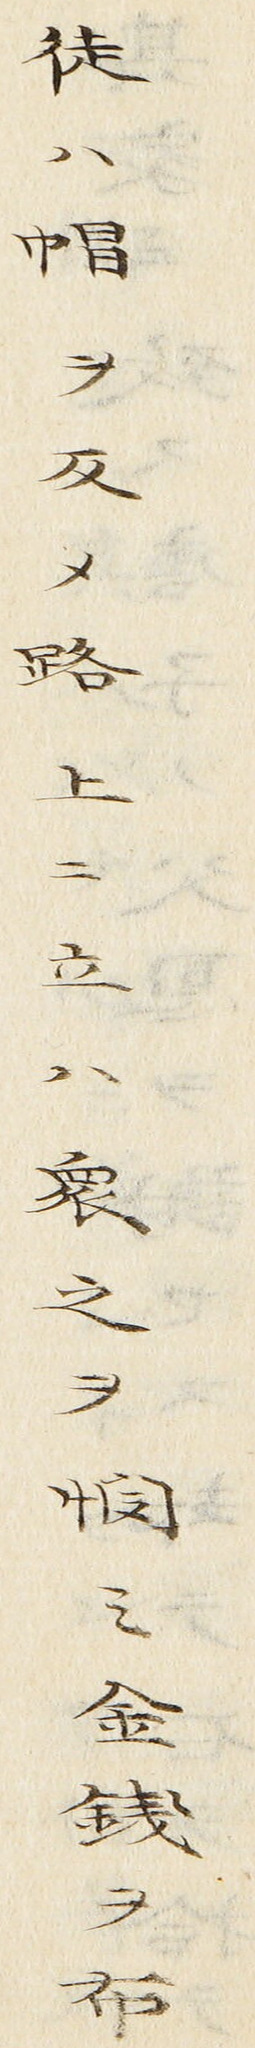徒ハ帽ヲ反シテ路上ニ立ハ衆之ヲ憫ミ金銭ヲ布
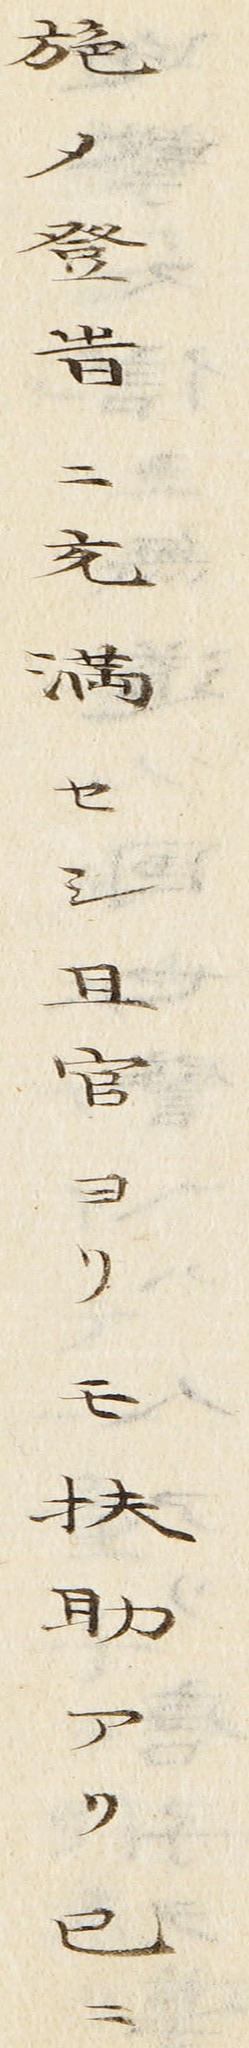施シテ登旹ニ充満セシ且官ヨリモ扶助アリ已ニ
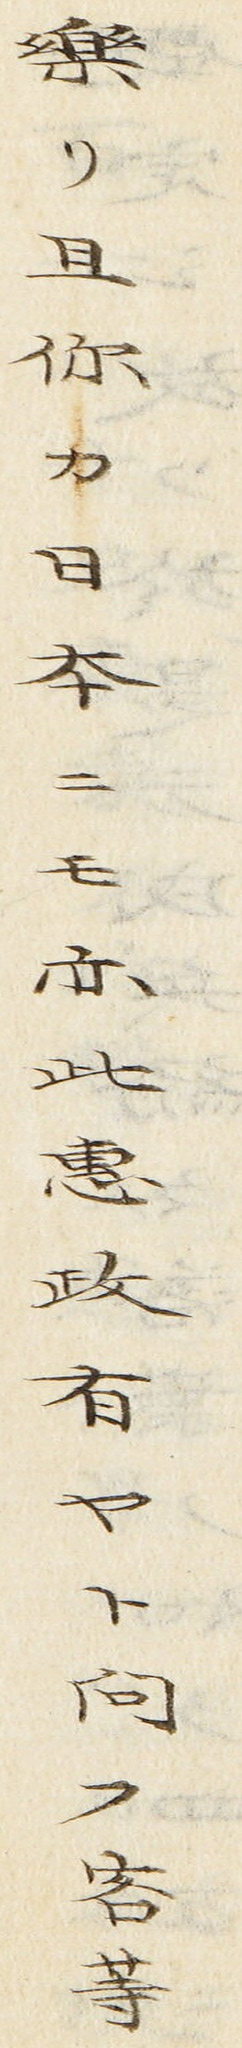樂リ且你カ日本ニモ亦此惠政有ヤト問フ客等
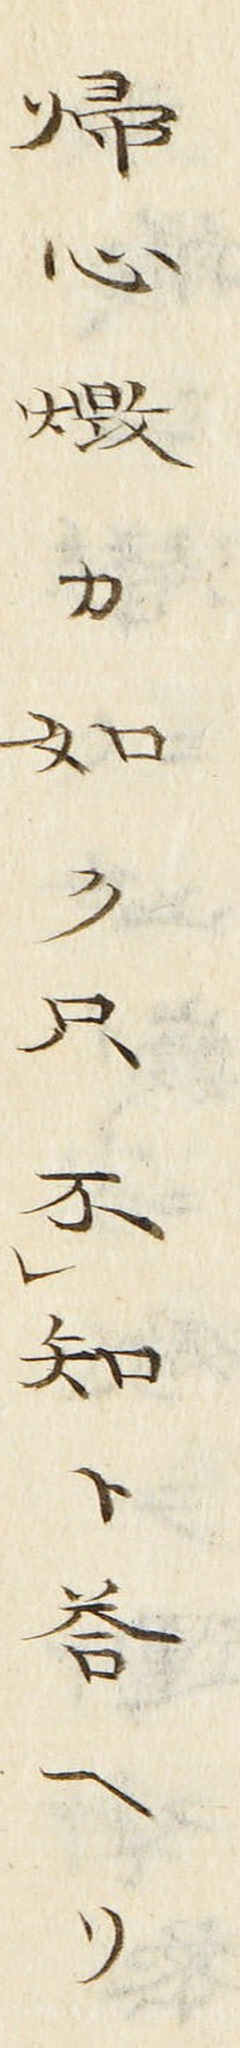帰心燬カ如ク只不知ト答ヘリ
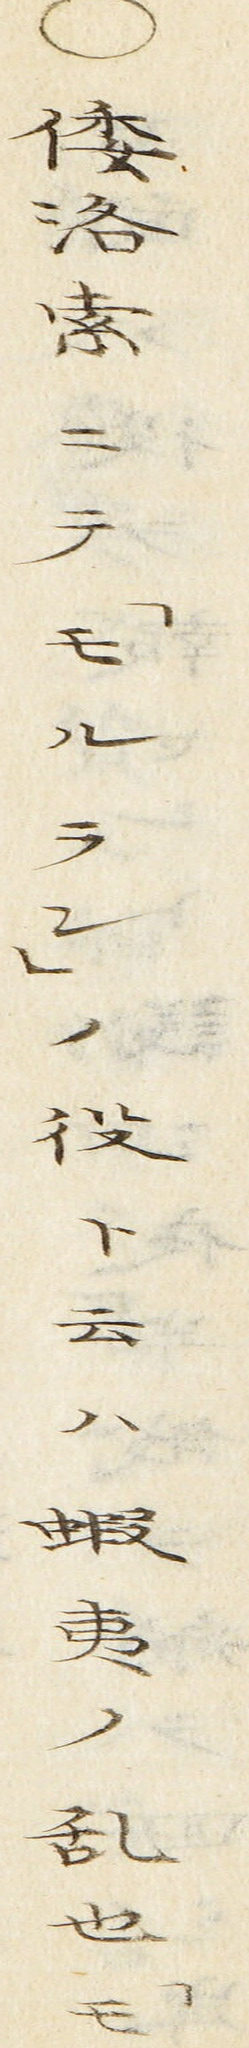〇倭洛索ニテ「モルラン」ノ役ト云ハ蝦夷ノ乱世「モ
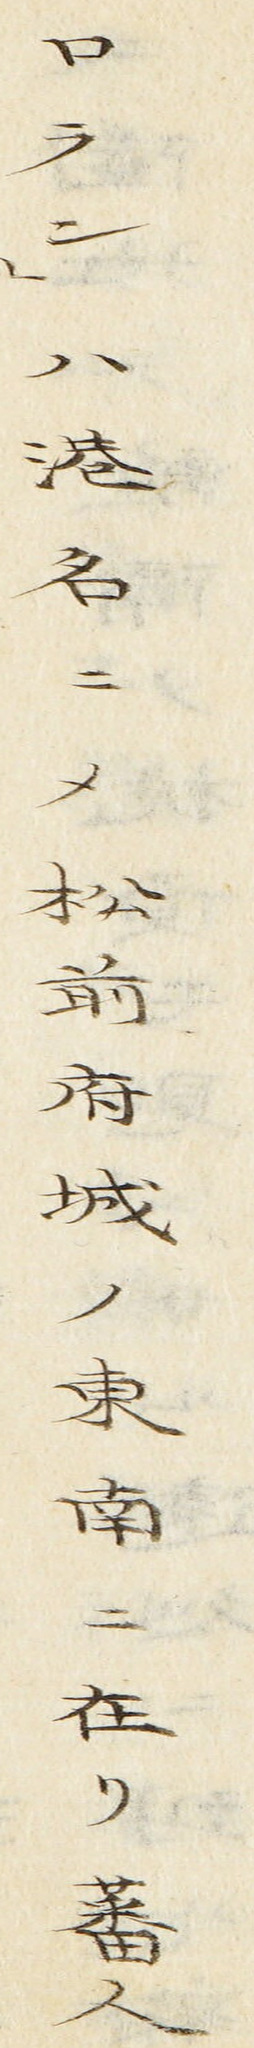ロラン」ハ港名ニシテ松前府城ノ東南ニ在リ蕃人
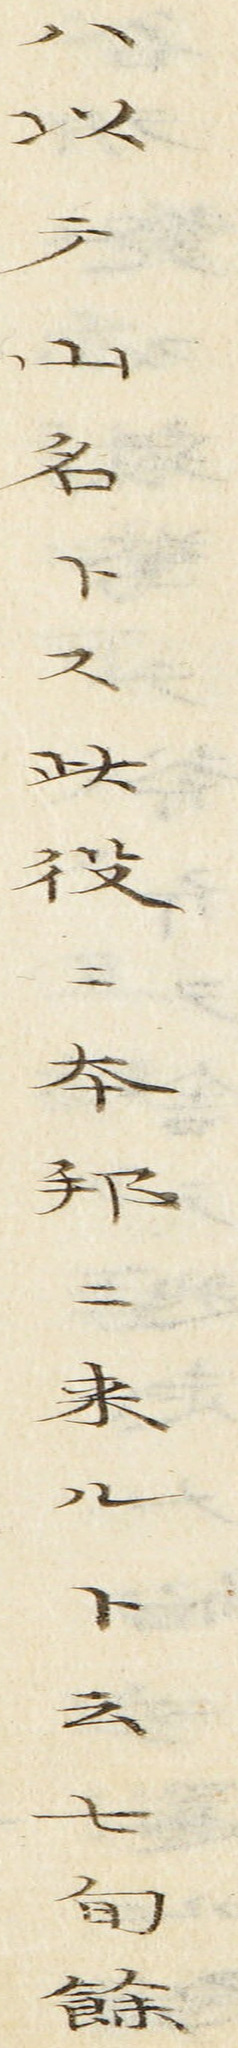ハ以テ山名トス此役ニ本邦ニ来ルト云七旬餘
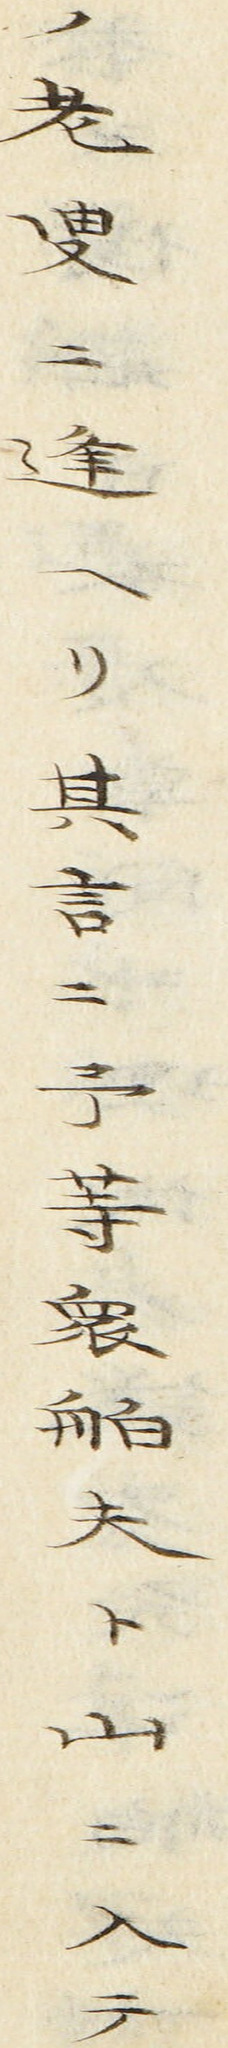ノ老叟ニ逢ヘリ其言ニ予等衆舶夫ト山ニ入テ

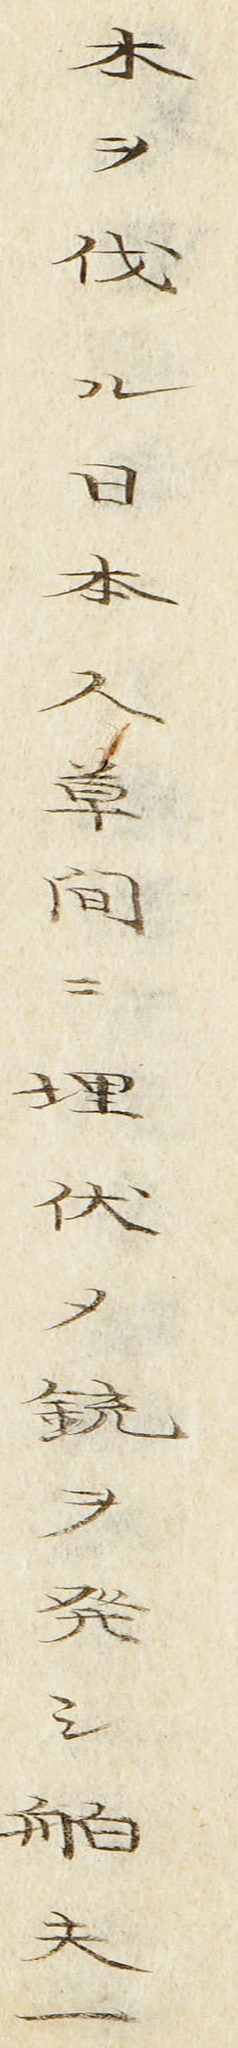木ヲ伐ル日本人草間ニ埋伏シテ銃ヲ発シ舶夫一
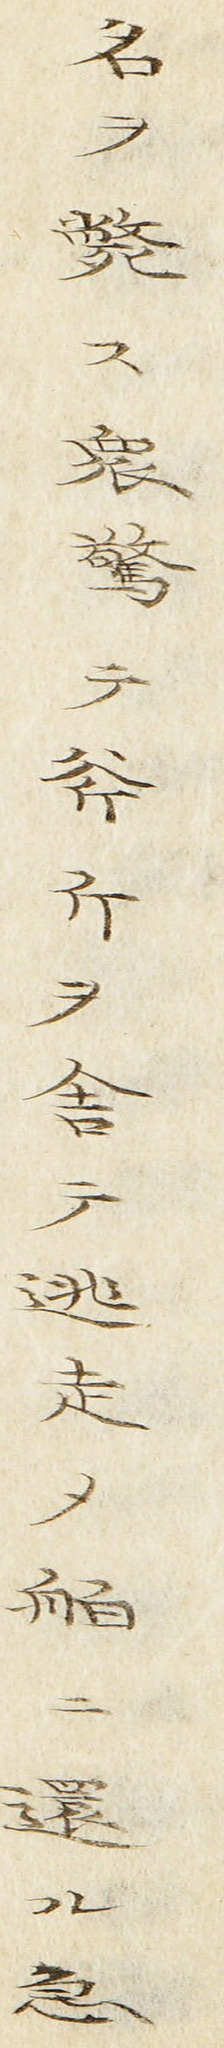名ヲ斃ス衆驚テ斧斤ヲ舎テ逃走シテ舶ニ還ル急
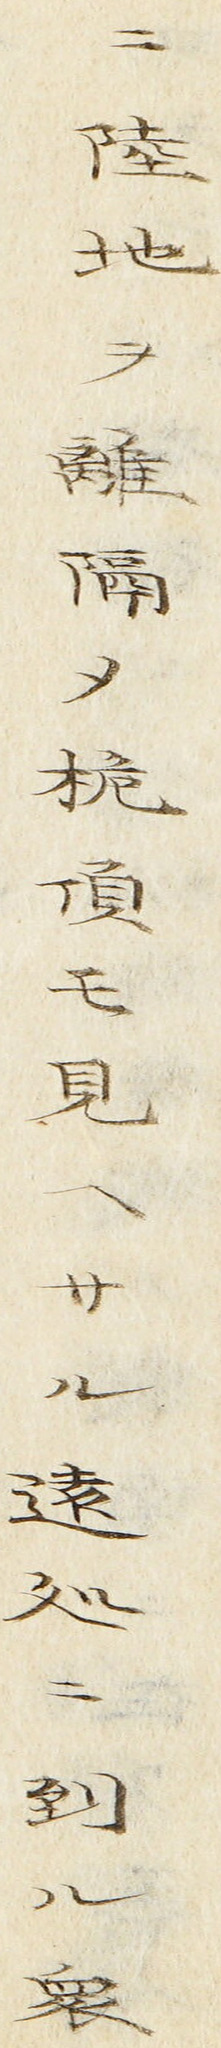ニ陸地ヲ離隔シテ桅頂モ見ヘサル遠処ニ到ル衆
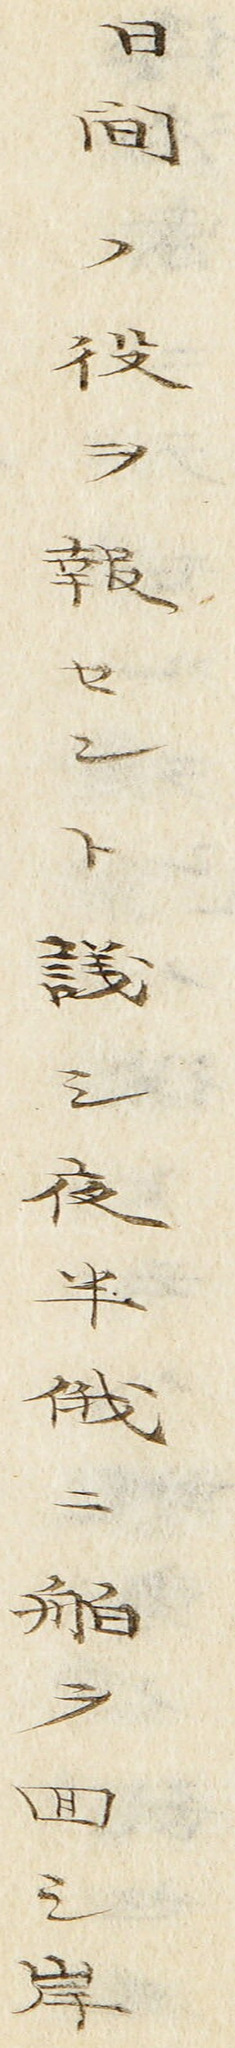日間ノ役ヲ報セント議シ夜半俄ニ舶ヲ回シ岸
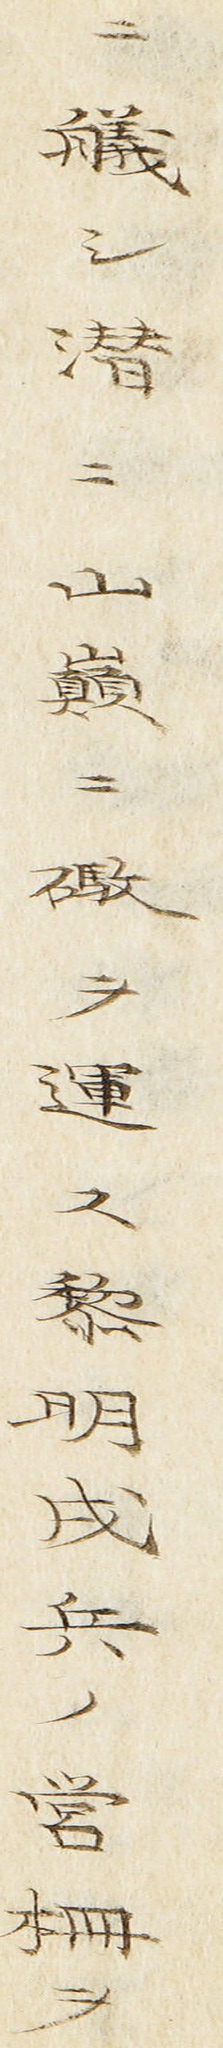ニ艤シ潜ニ山巓ニ礟ヲ運ス黎明戍兵ノ営柵ヲ
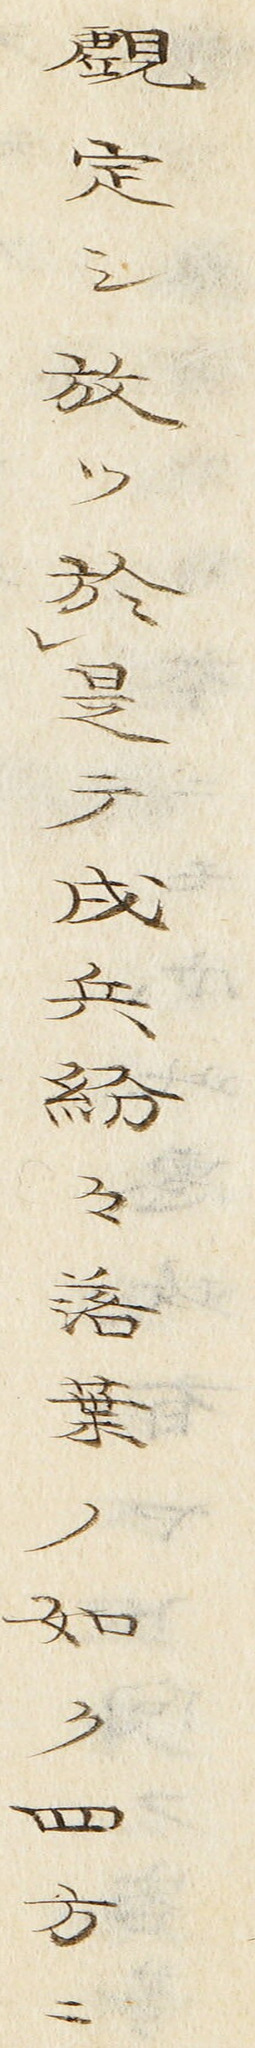覷？定シ放ツ於是テ戍兵紛々落葉ノ如ク四方ニ
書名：蕃談
